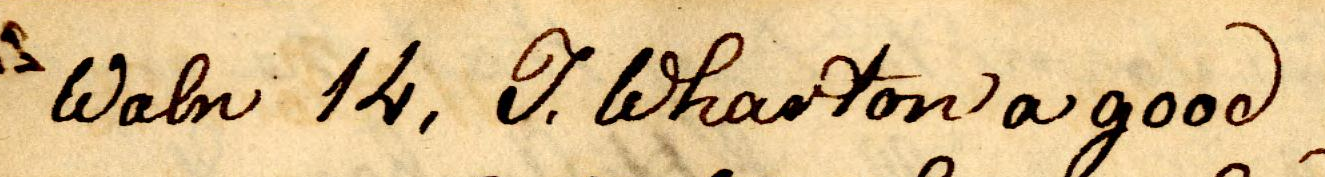Waln 14, T. Wharton a good
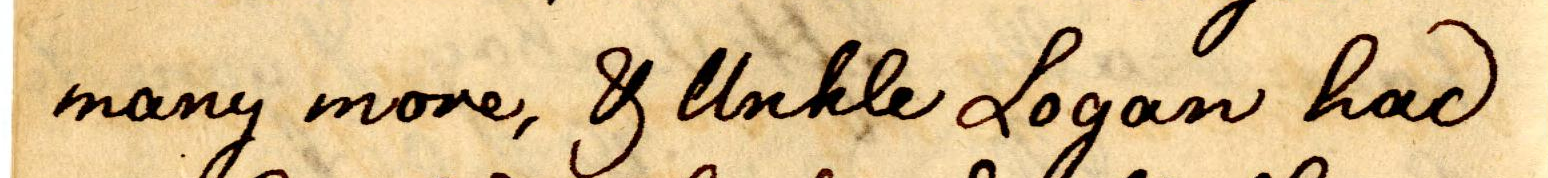many more, & Unkle Logan had
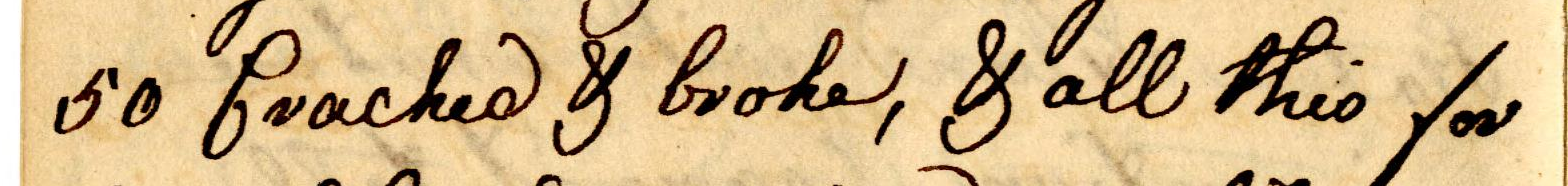50 Cracked & broke, & all this for
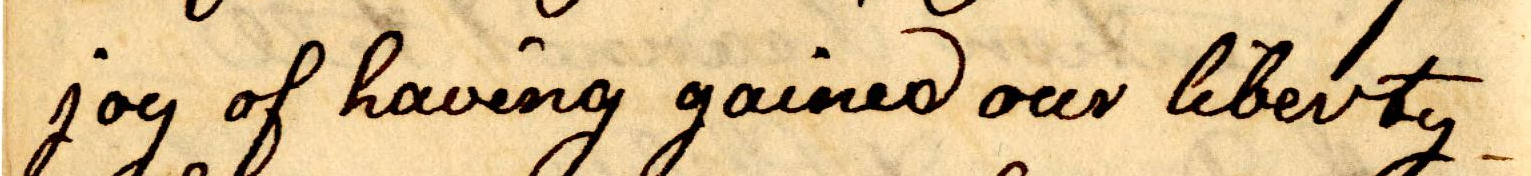joy of having gained our liberty
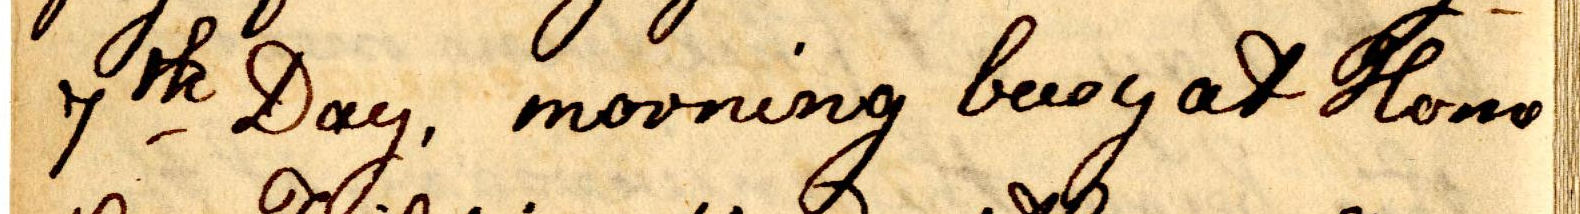7^th Day. morning busy at Home
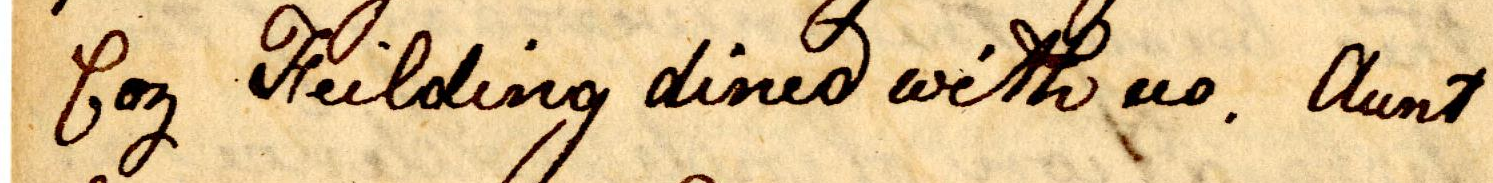Coz Feilding dined with us. Aunt
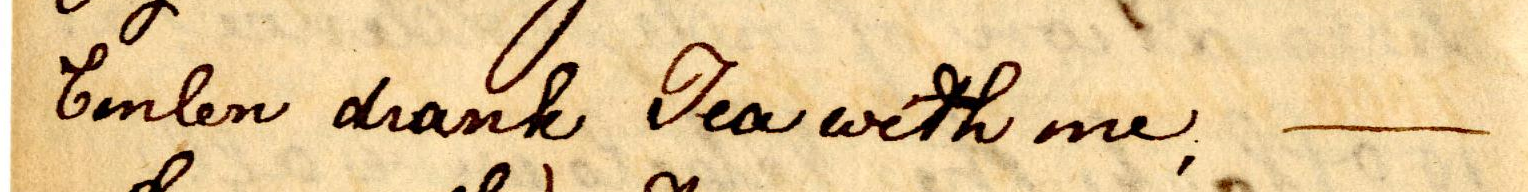Emlen drank Tea with me,-
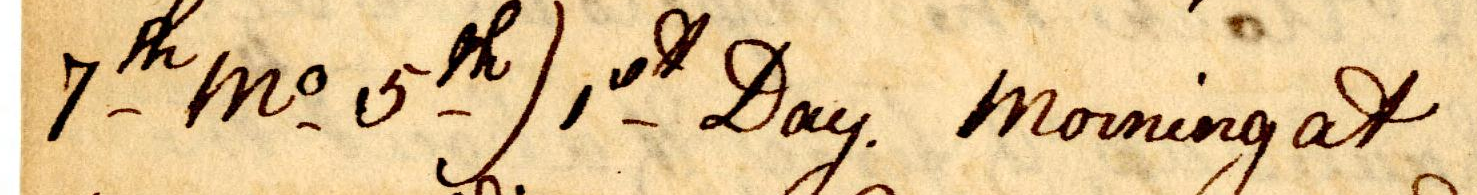7^th M^o 5^th ) 1^st Day. Morning at
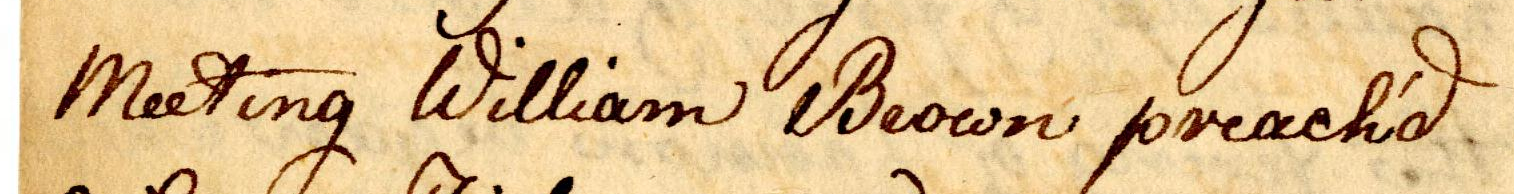Meeting William Brown preach'd
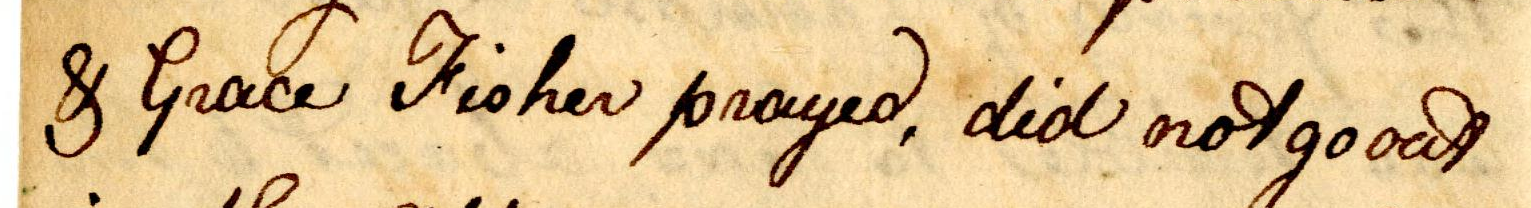& Grace Fisher prayed, did not go out
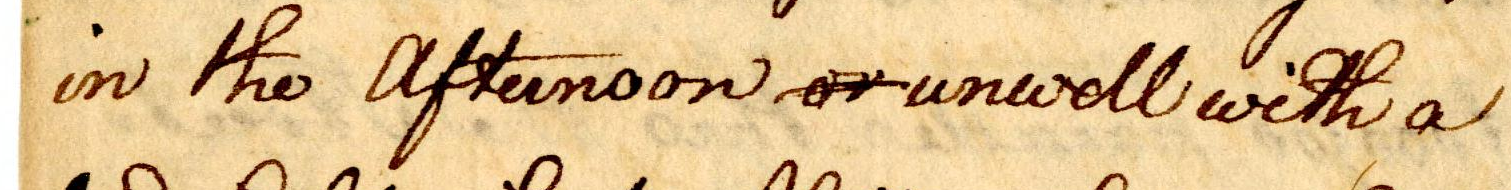in the Afternoon [or] unwell with a
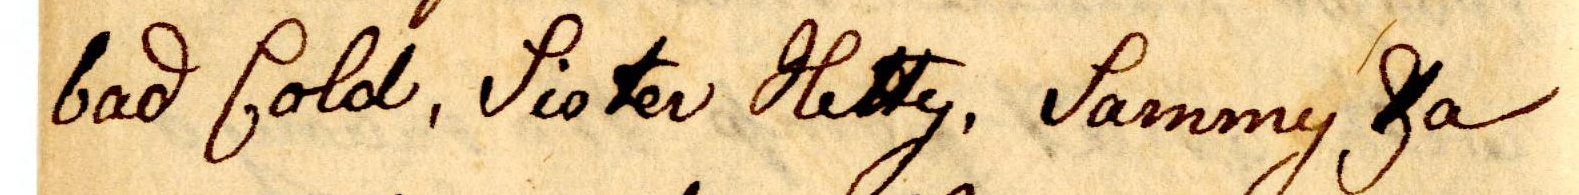bad Cold, Sister Hetty, Sammy & a
